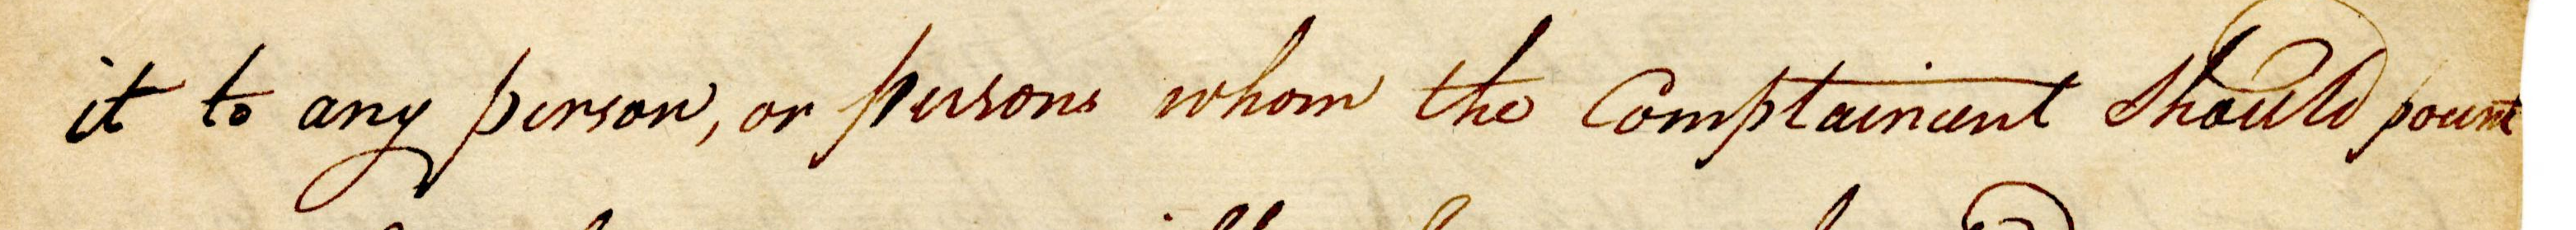it to any person, or persons whom the Complainant Should point
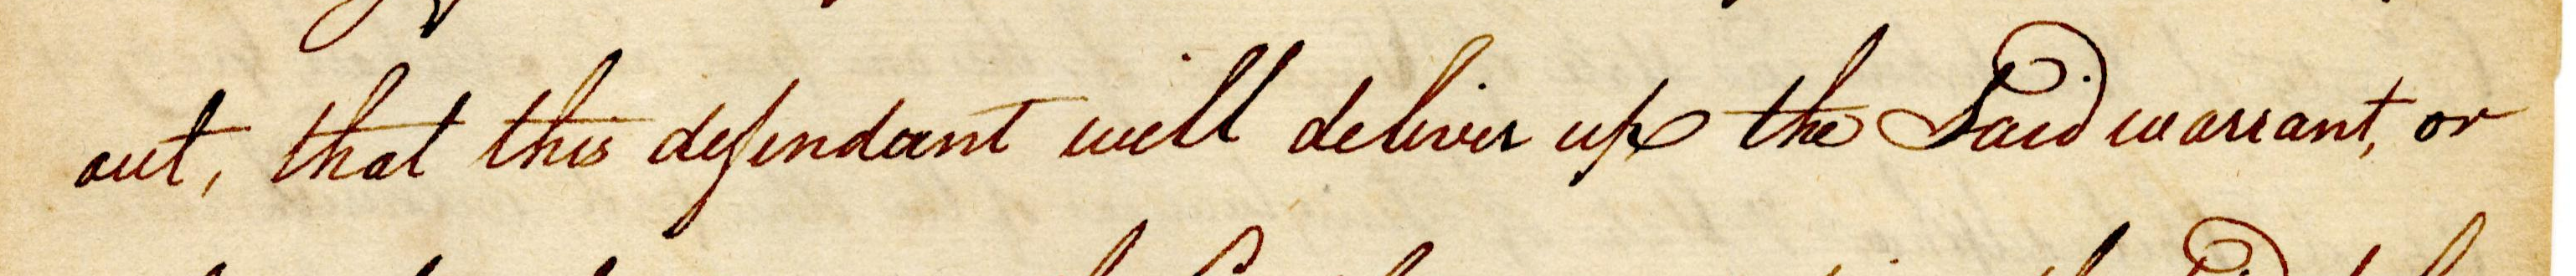out, that the defendant well deliver up the Said warrant or
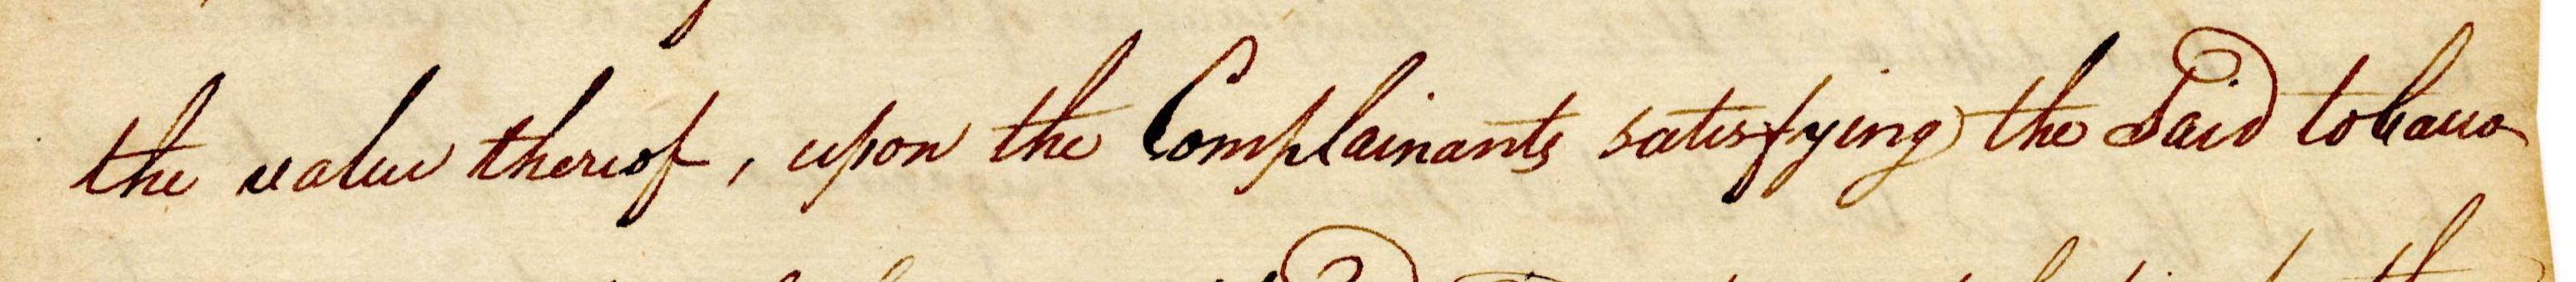the value thereof, upon the Complainants satisfying the said to tobacco
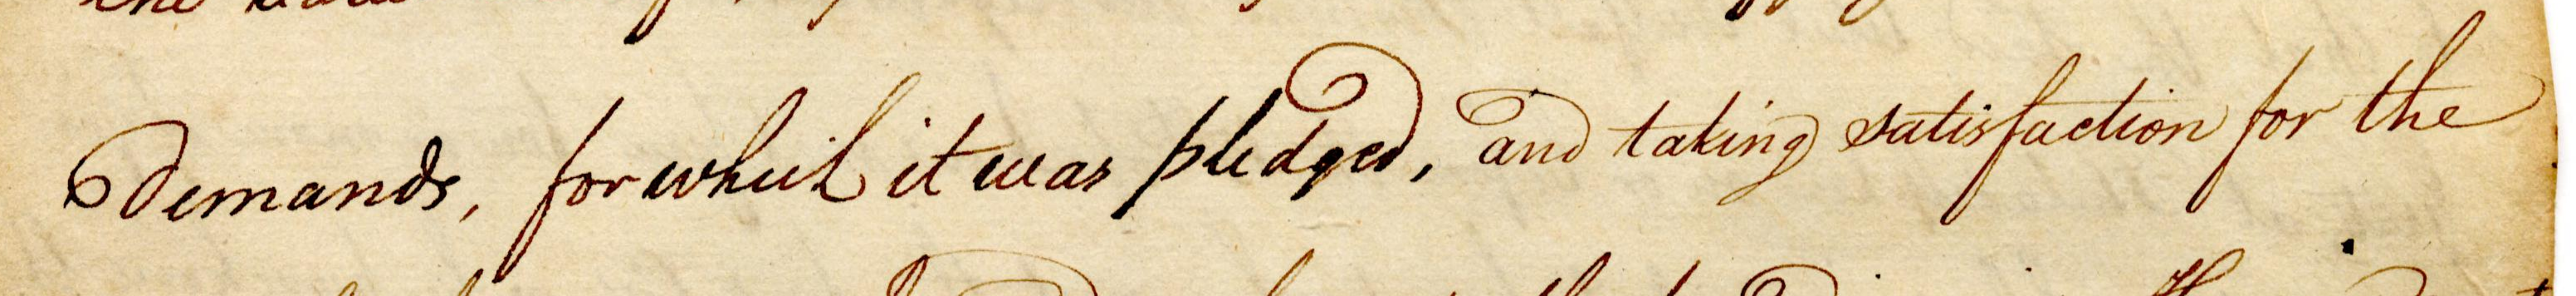demands, for which it was pledged, and taking satisfaction for the
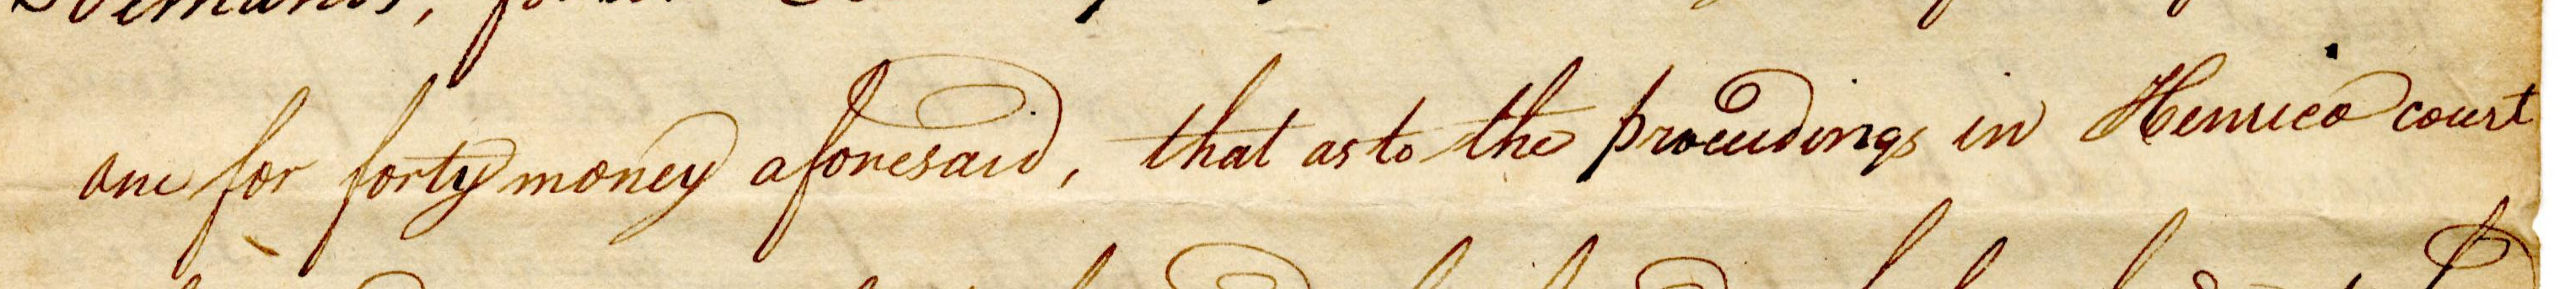one for forty money aforesaid, that also the preceding in Hemico court
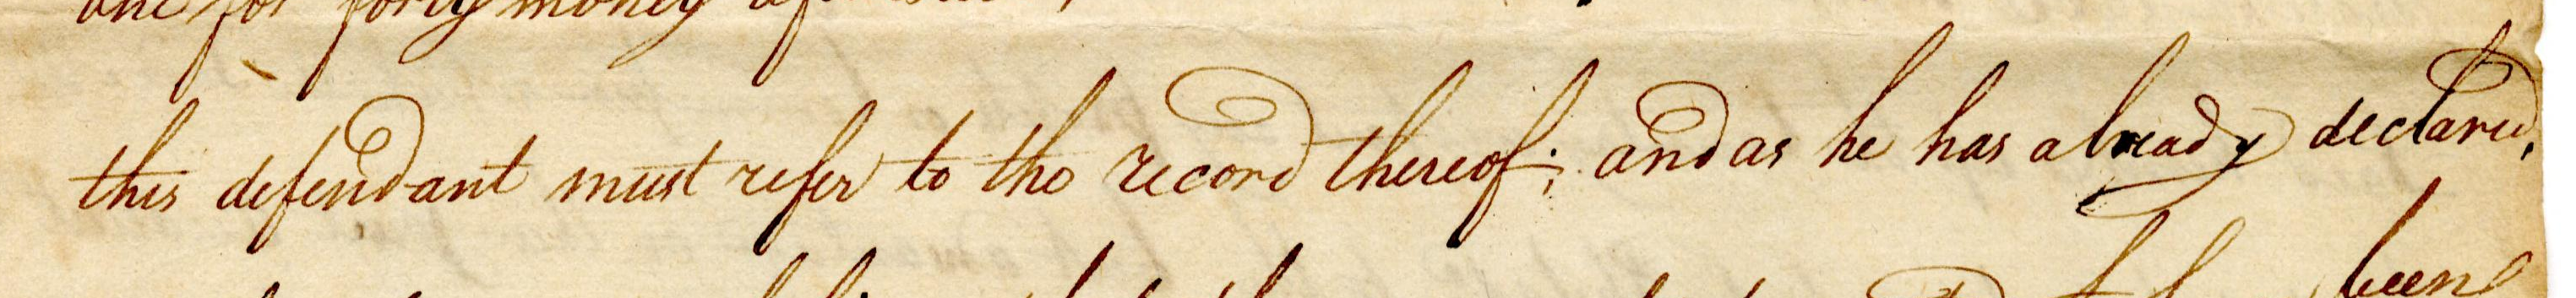this defendant must refer to the record thereof, and as he has already declared
